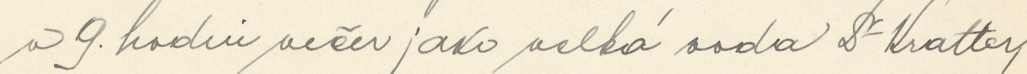v 9. hodin večer jako velká voda Dr Kratter
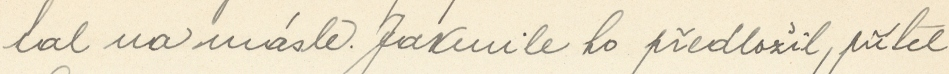tal na másle. Jakmile ho předložil, přítel
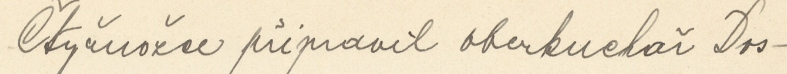Čtyřnožce připravil oberkuchař Dos-
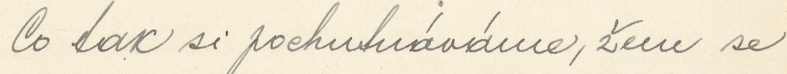Co tak si pochutnáváme, žene se
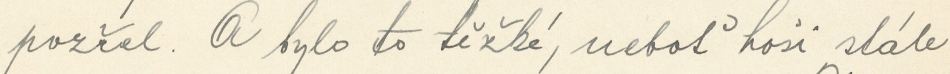pozřel. A bylo to těžké, neboť hoši stále
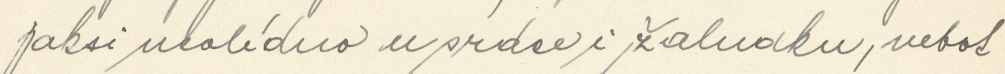jaksi nevlídno u srdce i žaludku, neboť
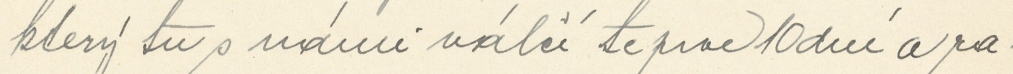který tu s námi válčí teprve 10 dní a ra-
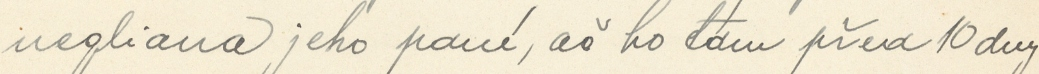negliana, jeho paní, ač ho tam před 10 dny
